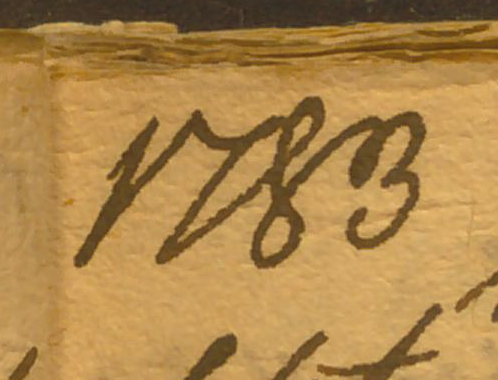1783
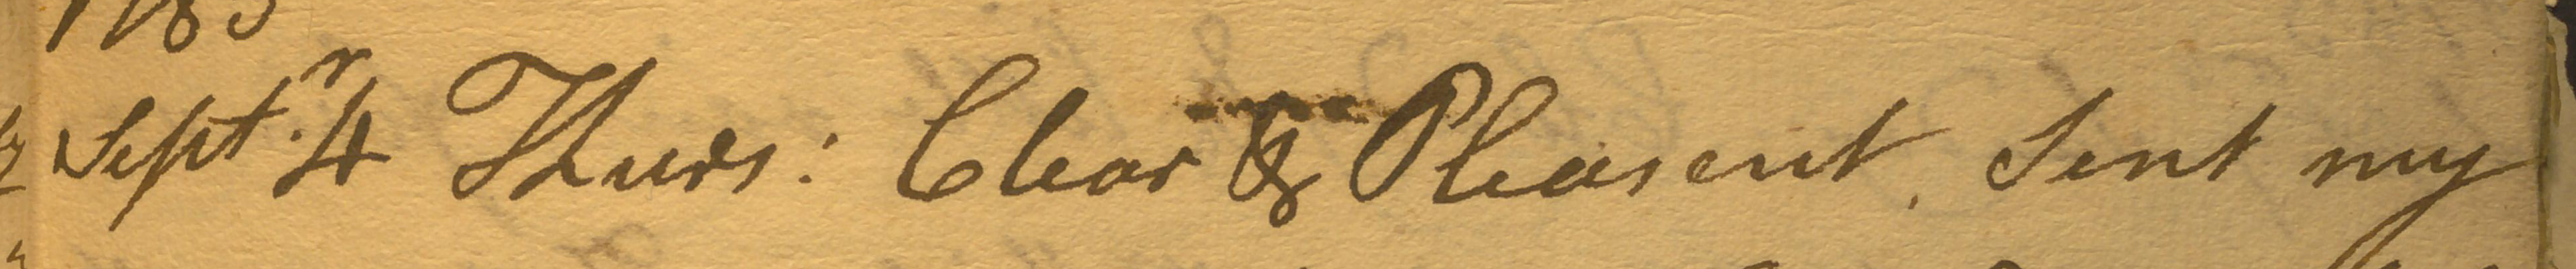Sept^r. 4 Thurs: Clear & Pleasent Sent my
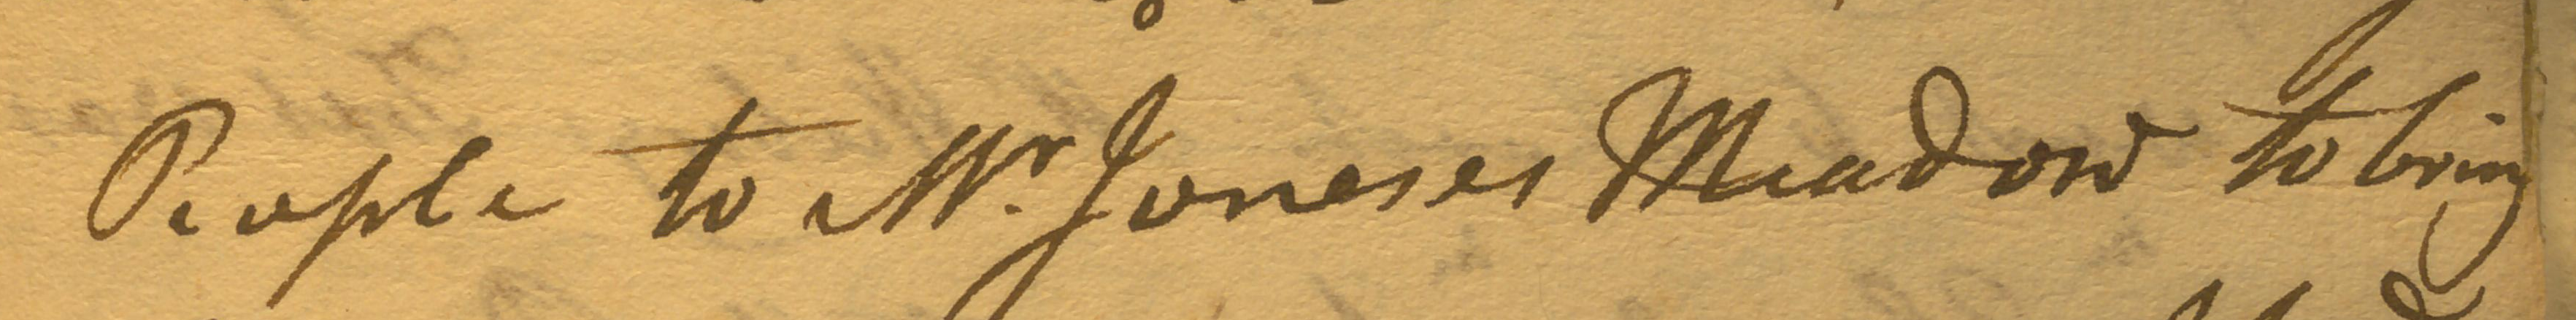People to M^r. Joneses Meadow to bring
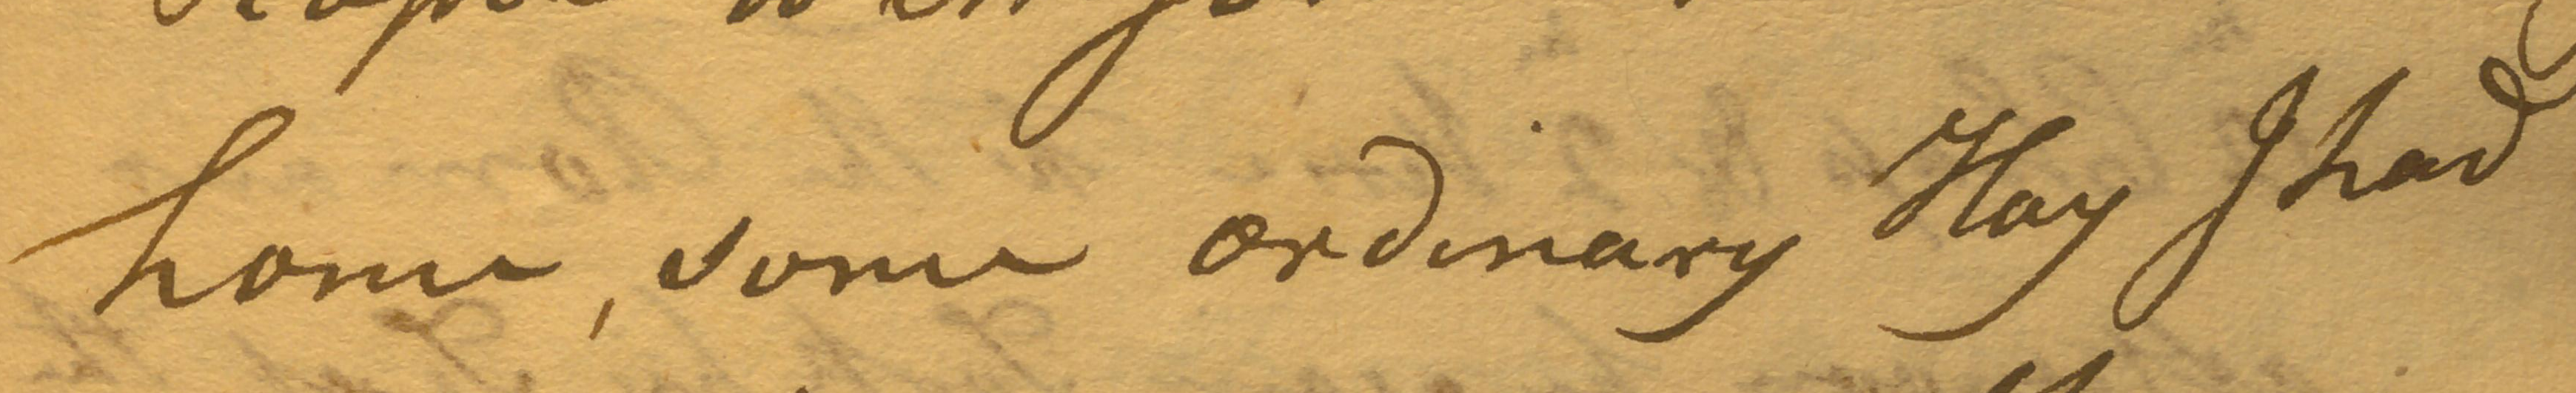home sone ordinary Hay I had
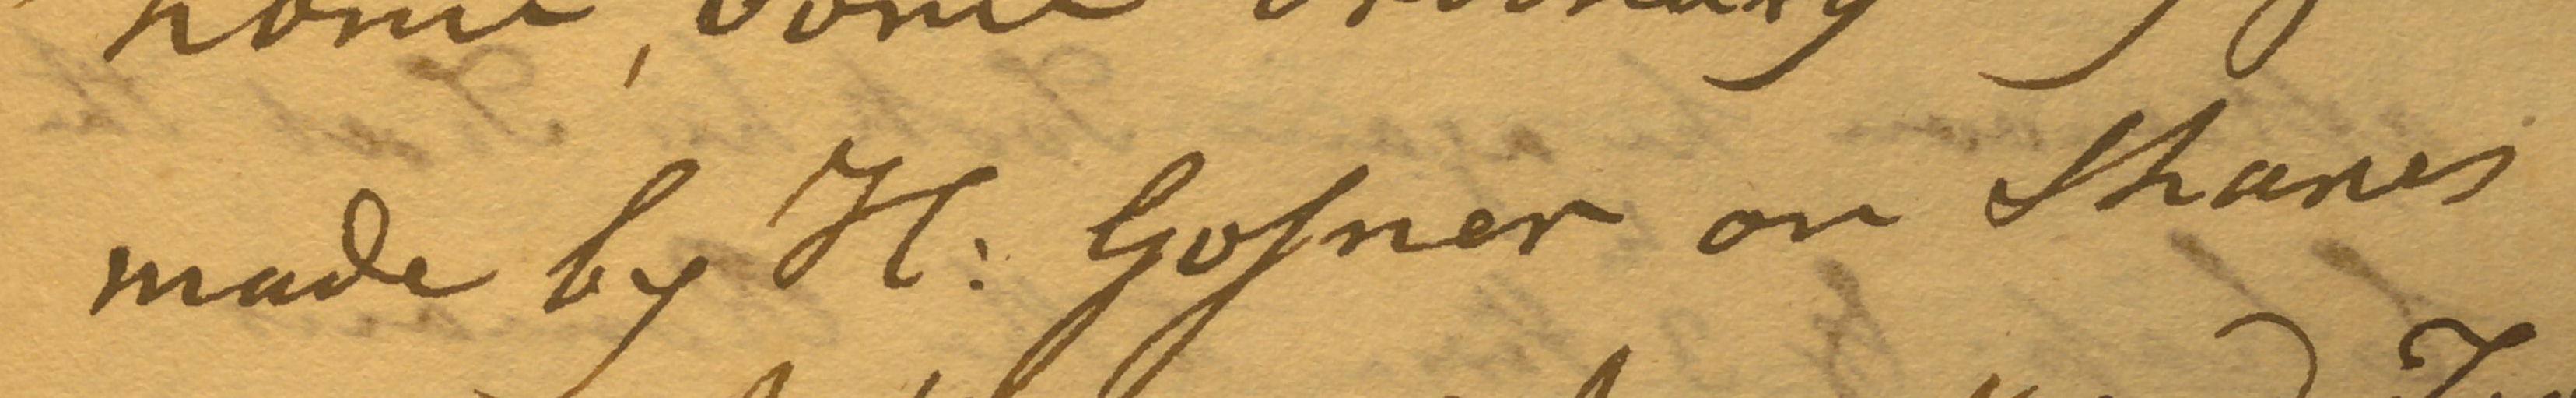made by H. Gosner on Shares
